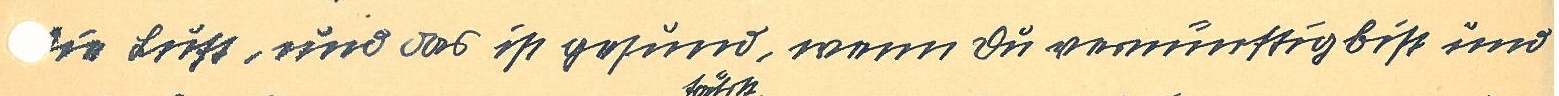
ie Luft, und das ist gesund, wenn Du vernünftig bist und
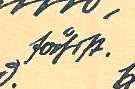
fährst.
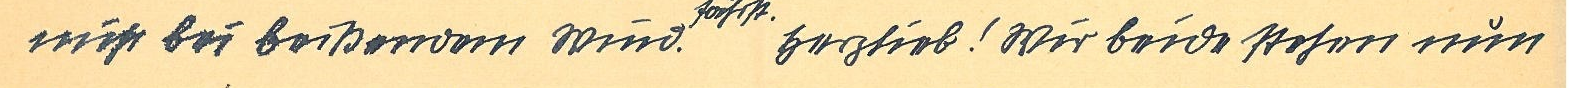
nicht bei beißendem Wind. Herzlieb! Wir beide stehen nun
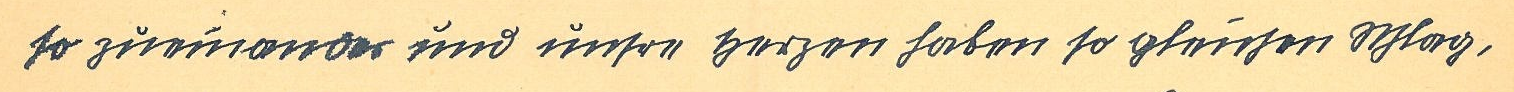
so zueinander und unsre Herzen haben so gleichen Schlag,
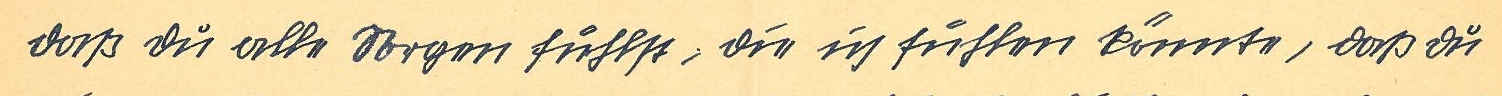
daß Du alle Sorgen fühlst, die ich fühlen könnte, daß Du
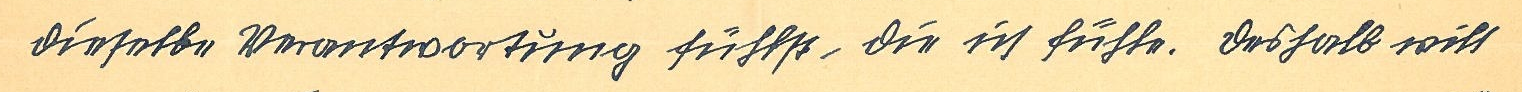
dieselbe Verantwortung fühlst, die ich fühle. Deshalb will
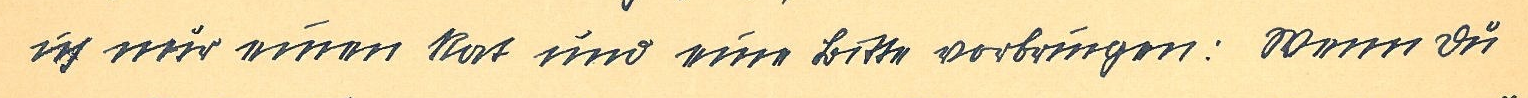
ich nur einen Rat und eine Bitte vorbringen: Wenn Du
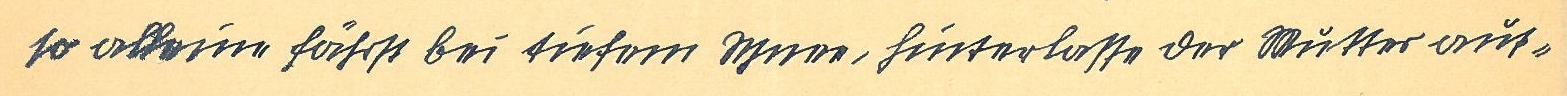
so allein fährst bei tiefem Schnee, hinterlasse der Mutter auf¬
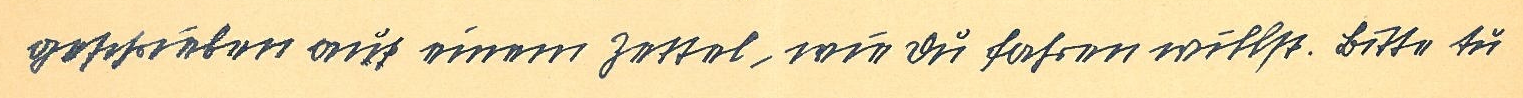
geschrieben auf einem Zettel, wie Du fahren willst. Bitte tu
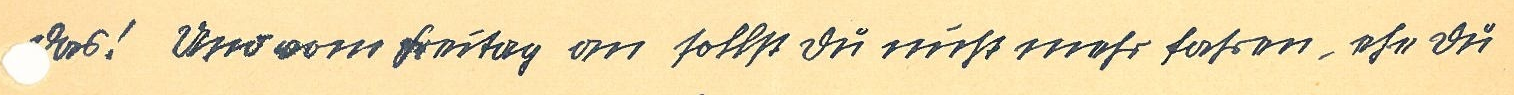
das! Und vom Freitag an sollst Du nicht mehr fahren, ehe Du
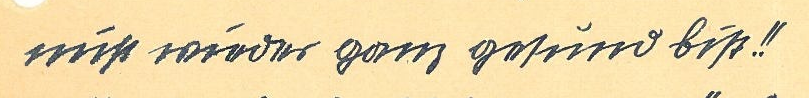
nicht wieder ganz gesund bist!!
